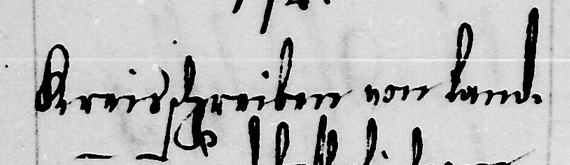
Kreisschreiben des Stan¬
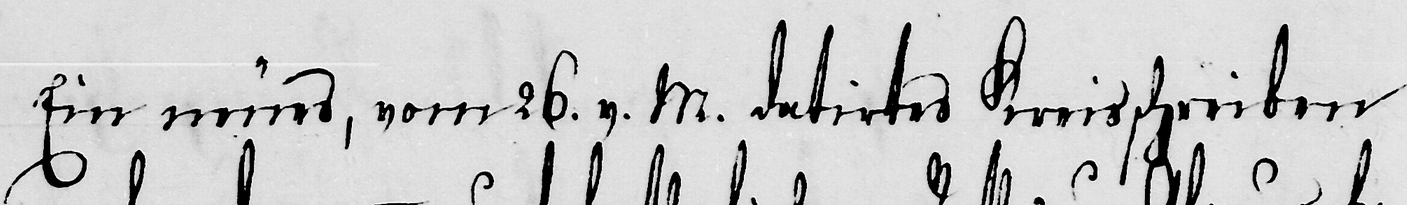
Ein neues, vom 26. v. M. datirtes Kreisschreiben
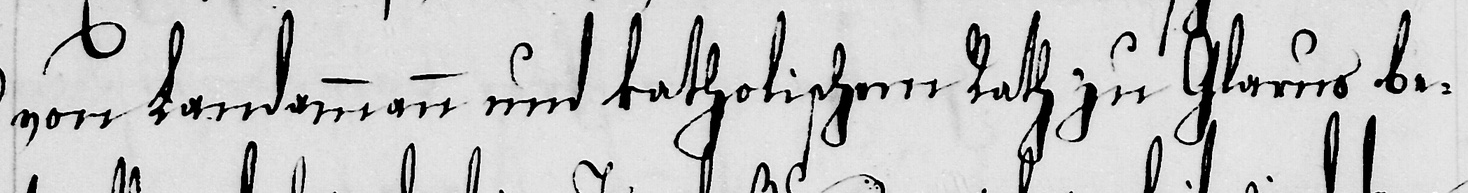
von Landammann und katholischem Rath zu Glarus be¬
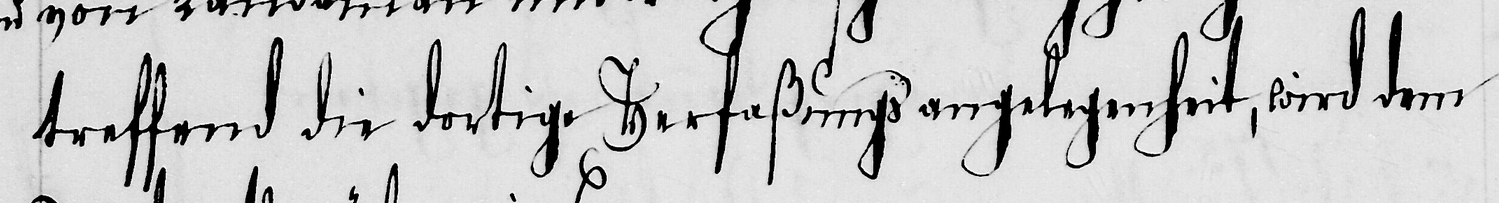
treffend die dortige Verfaßungsangelegenheit, wird dem
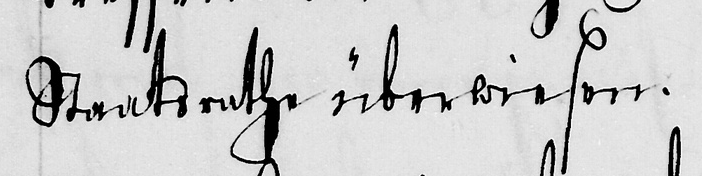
Staatsrathe überwiesen.
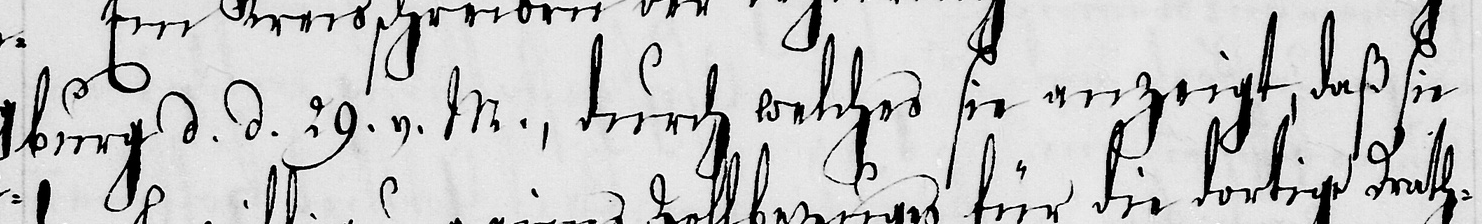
burg d. d. 29. v. M., durch welches sie anzeigt, daß sie
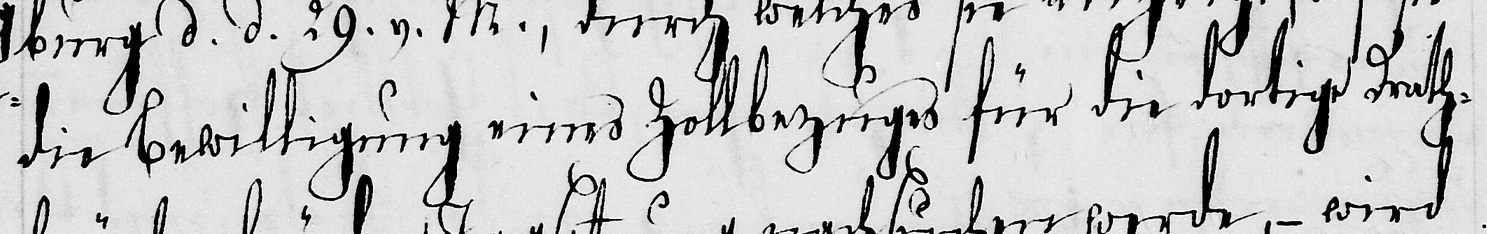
die Bewilligung eines Zollbezuges für die dortige Drat¬
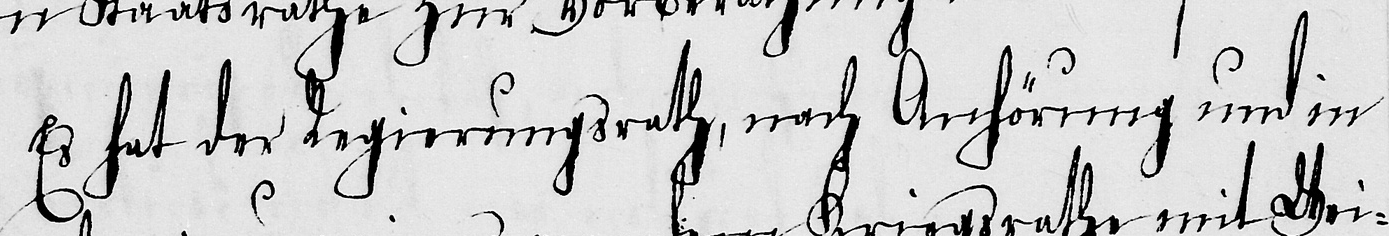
Es hat der Regierungsrath, nach Anhörung und in
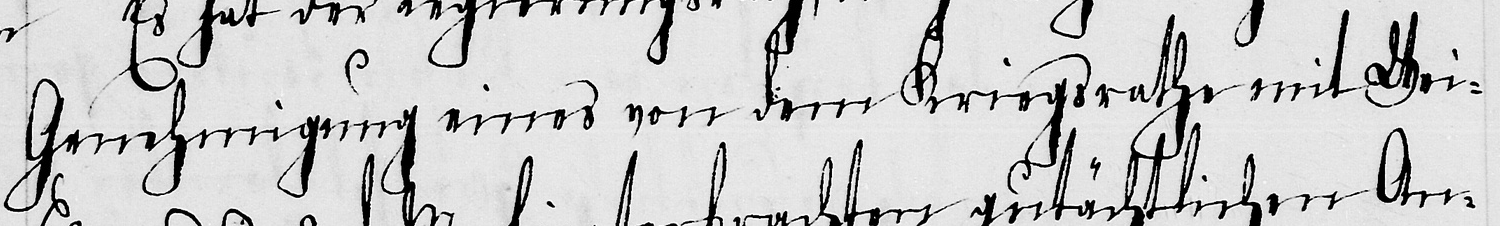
Genehmigung eines von dem Kriegsrathe mit Wei¬
